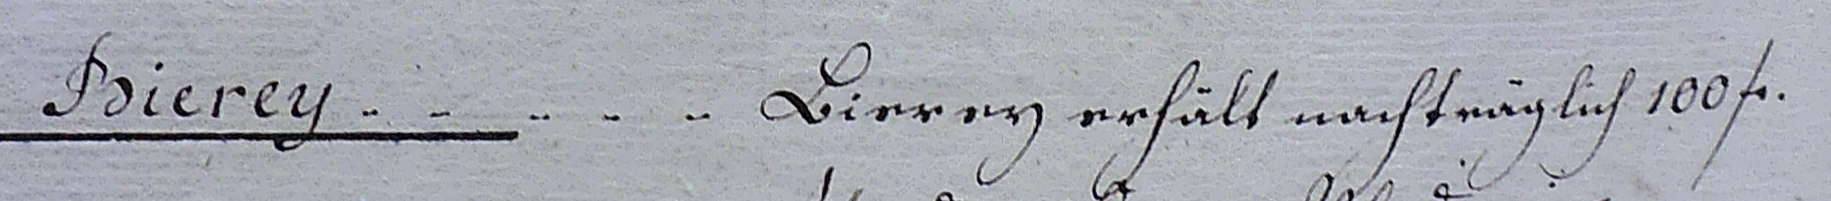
Bierey .. .. .. .. .. Bierey erhält nachträglich 100fr.
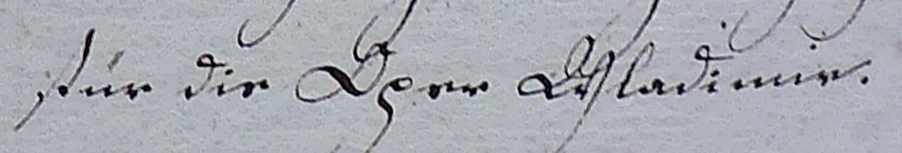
für die Oper Wladimir.
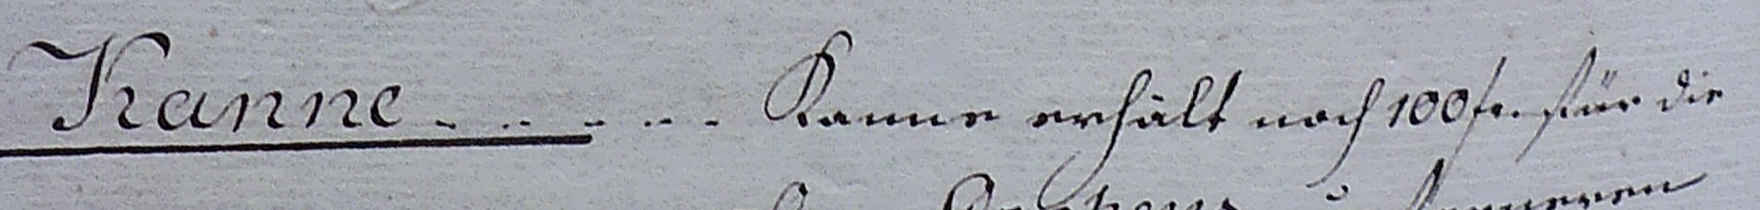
Kanne .. .. .. .. .. Kanne erhält noch 100fr. für die
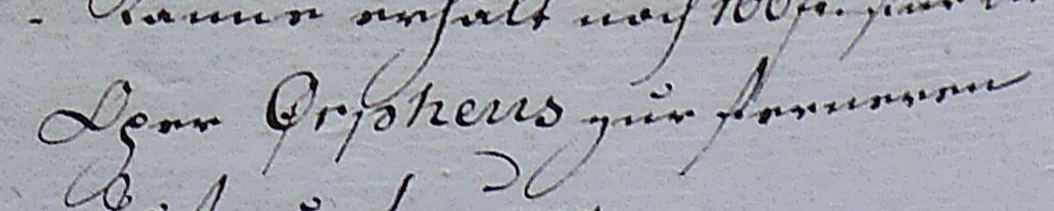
Oper Orpheus zur ferneren
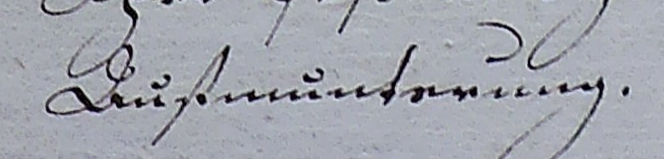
Aufmunterung.
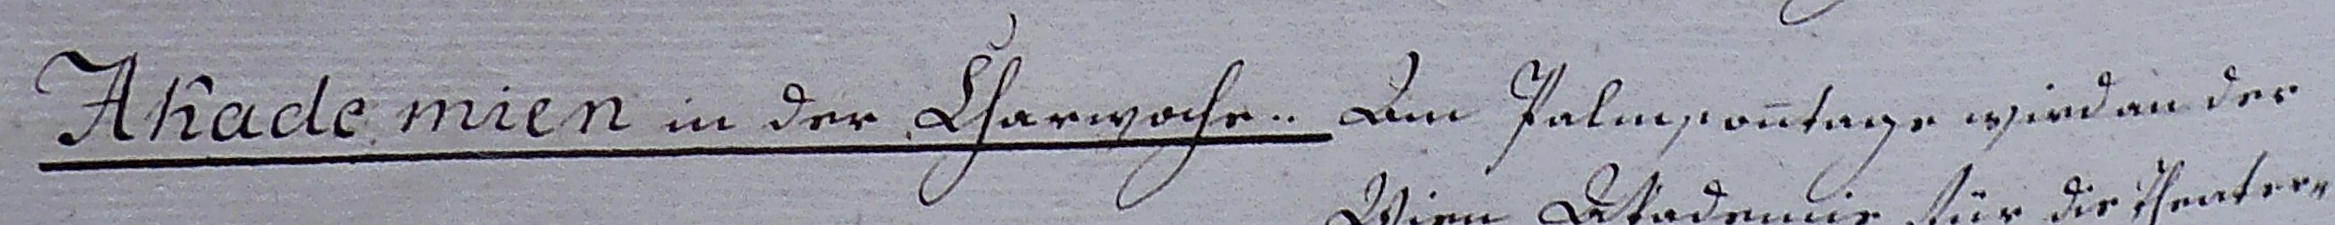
Akademien in der Charwoche .. Am Palmson̅tage wird an der
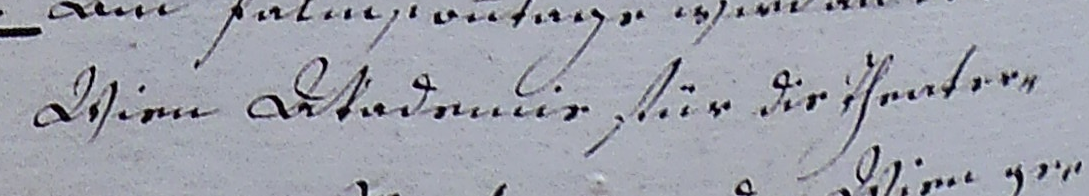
Wien Akademie für die Theater¬
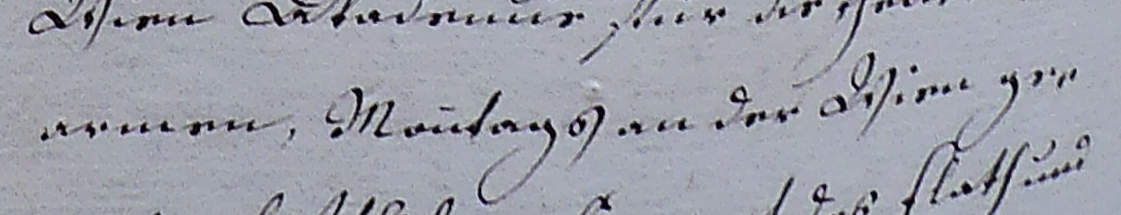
armen, Montags an der Wien ge¬
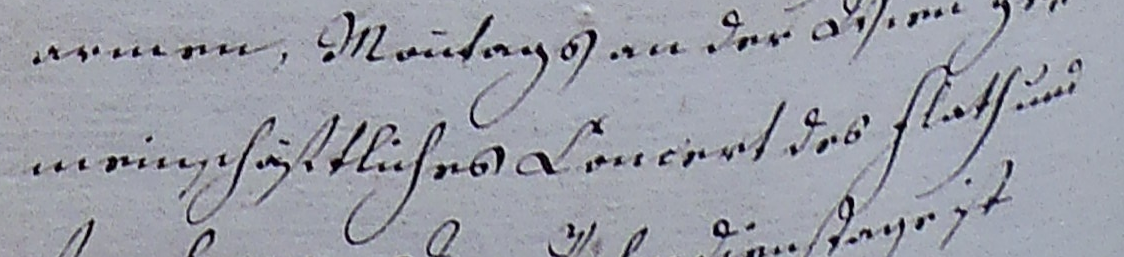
meinschäftliches Concert des Flath und
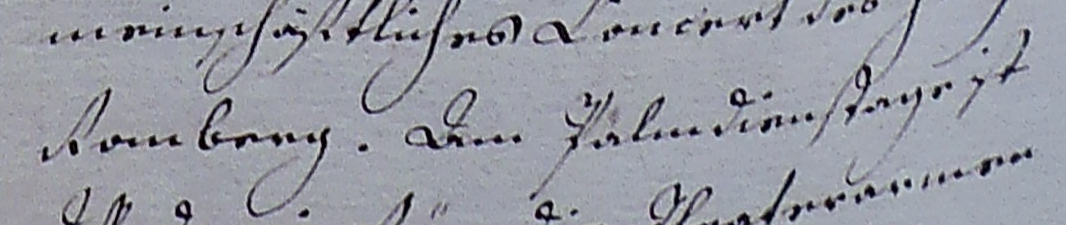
Romberg. An Palmdienstage ist
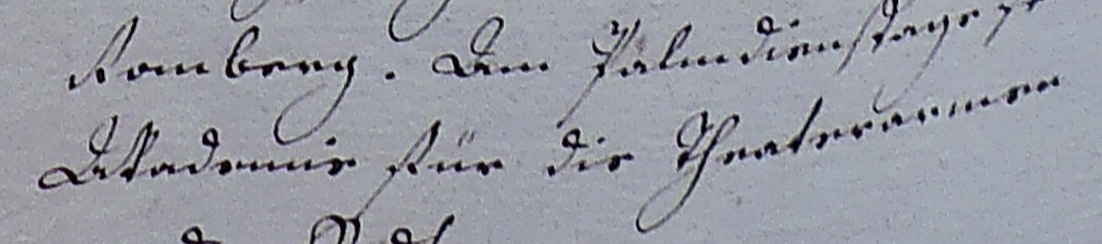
Akademie für die Theaterarmen
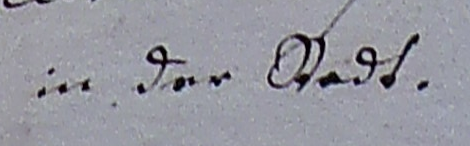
in der Stadt.
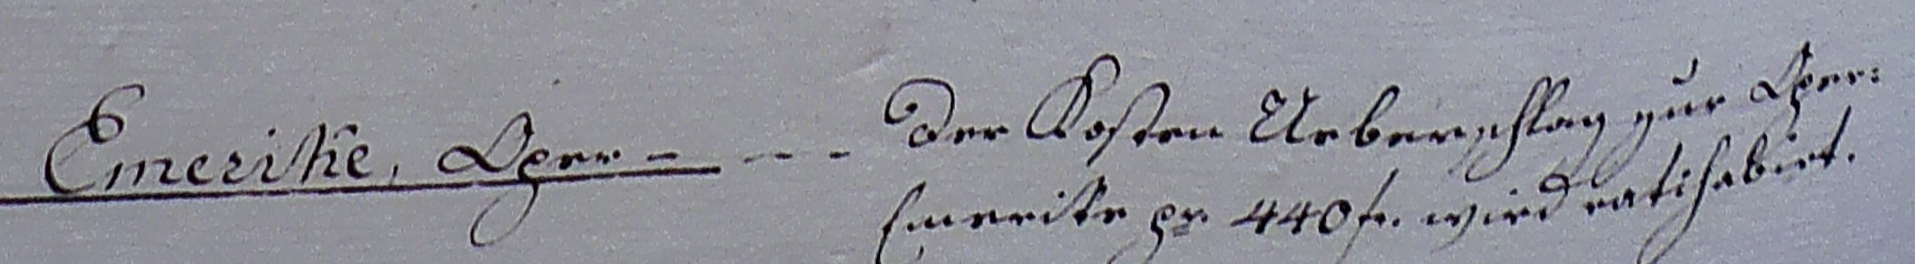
Emerike, Oper _ .. .Der Kosten Ueberschlag zur Oper:
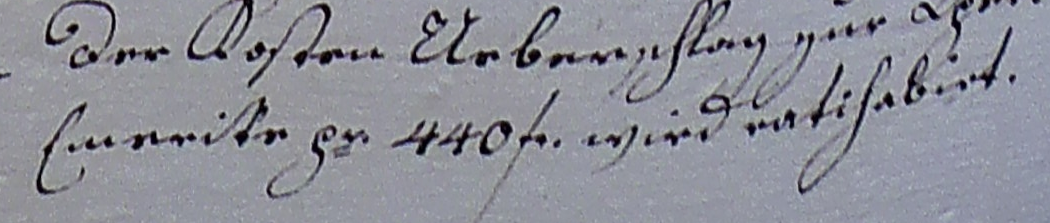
Emerike pr͇. 440fr. wird ratihabirt.
